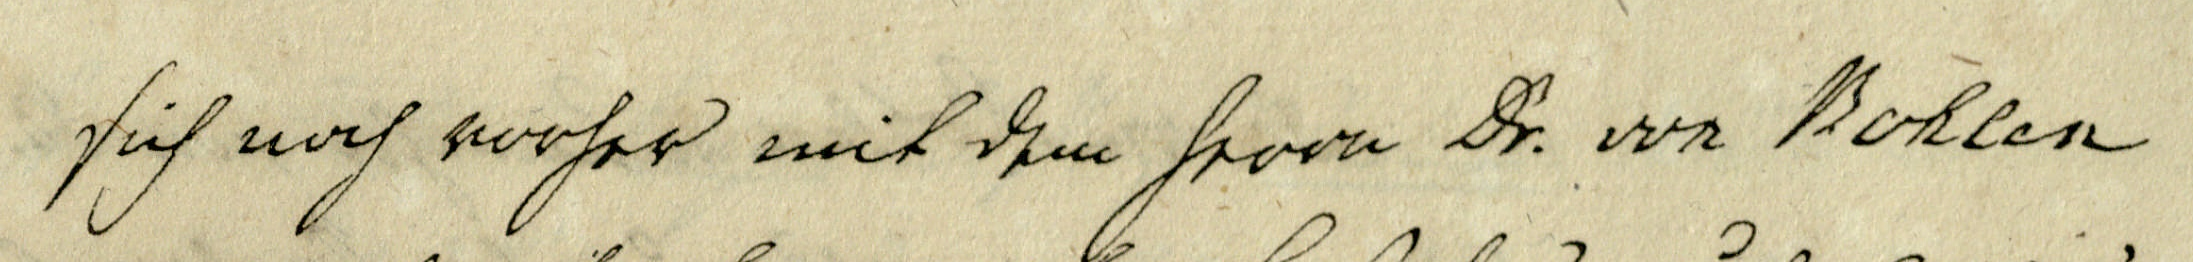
sich noch vorher mit dem Herrn Dr. von Bohlen
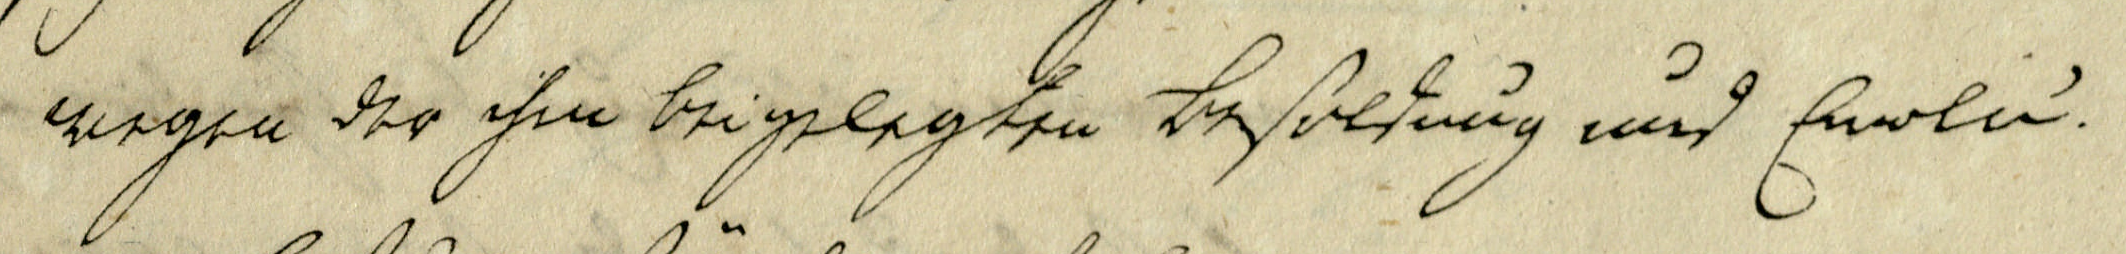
wegen der ihm beigelegten Besoldung und Emolu¬
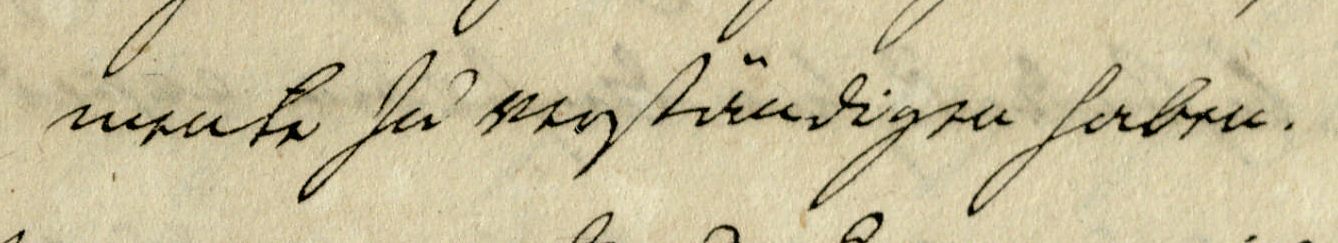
mente zu verständigen haben.
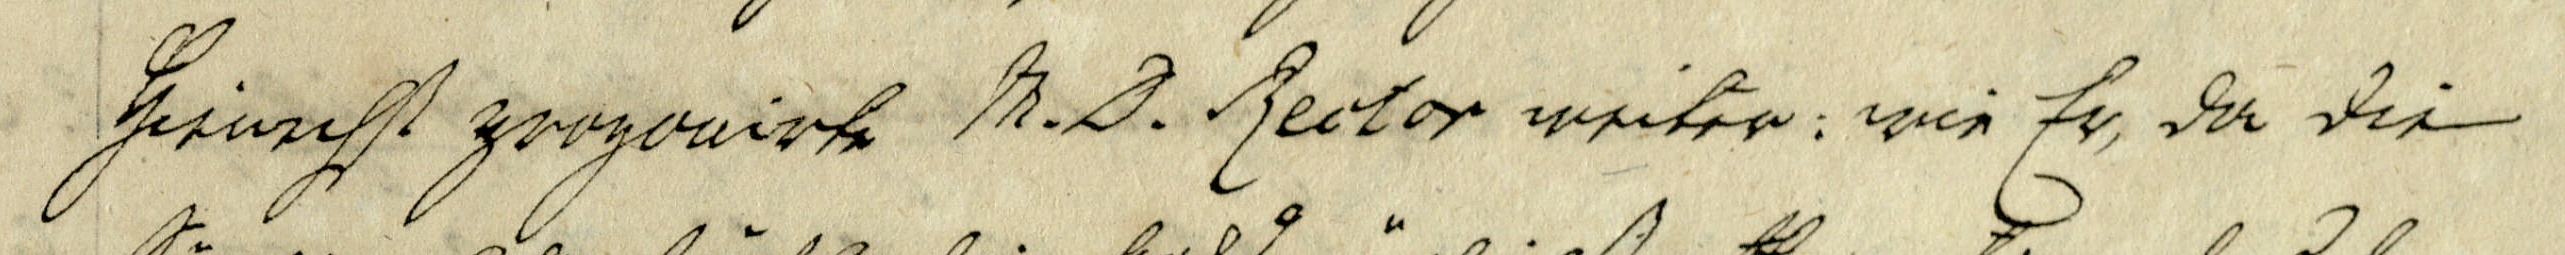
Hienechst proponirte M. D. Rector weiter, wie Er, da die
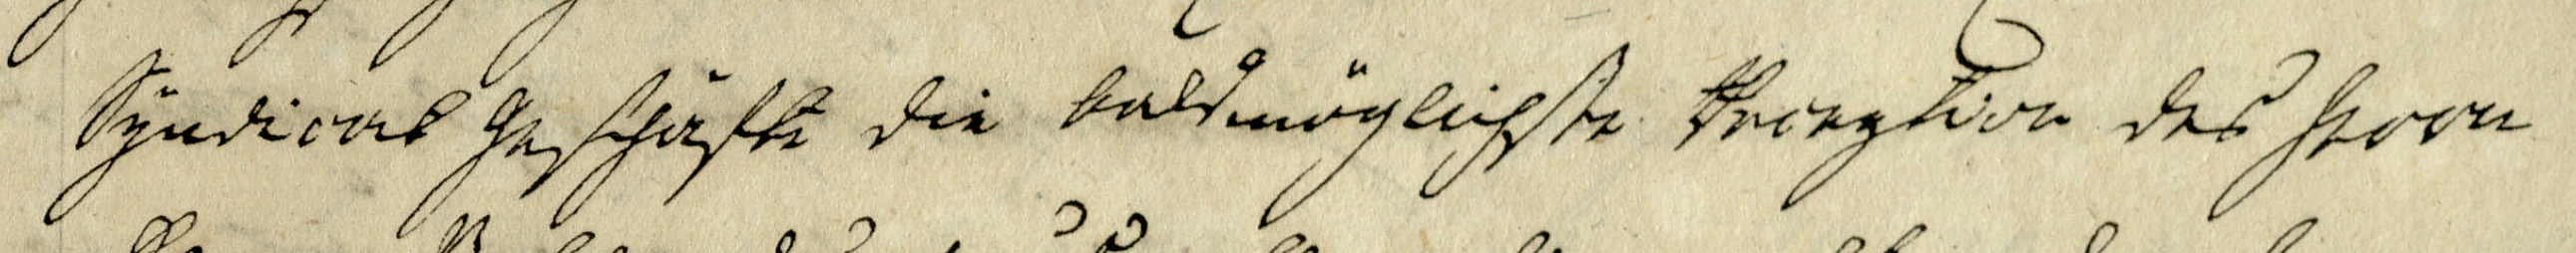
Sÿndicats Geschäfte die baldmöglichste Reception des Herrn
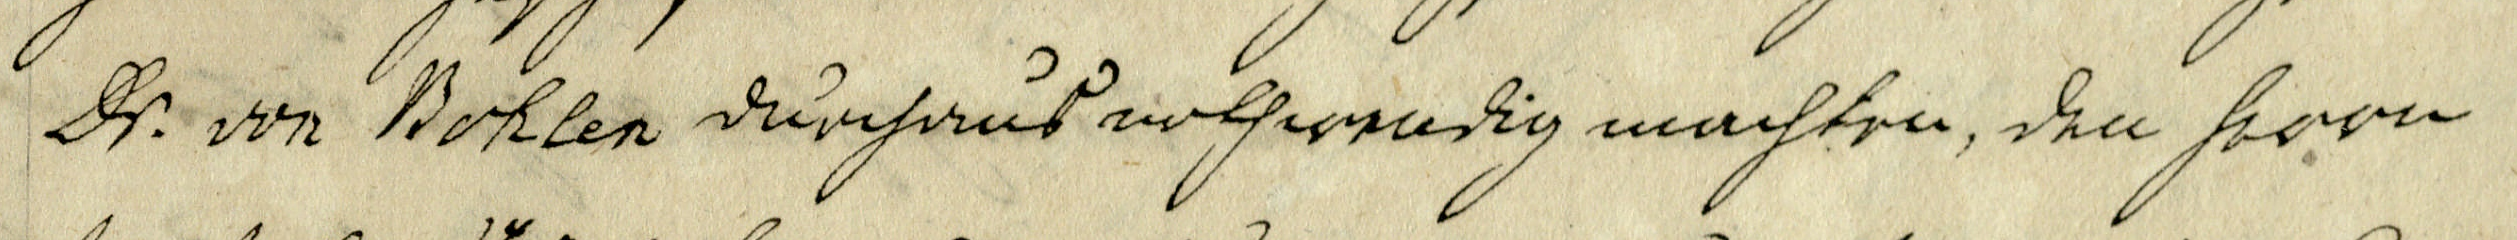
Dr. von Bohlen durchaus nothwendig machten, den Herrn
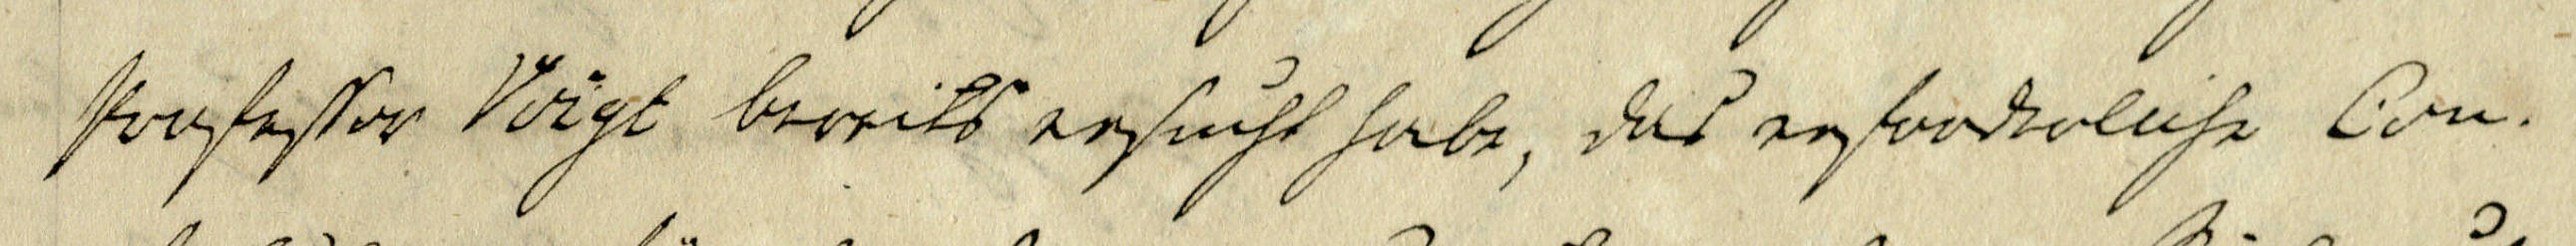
Professor Voigt bereits ersucht habe, das erforderliche Con¬
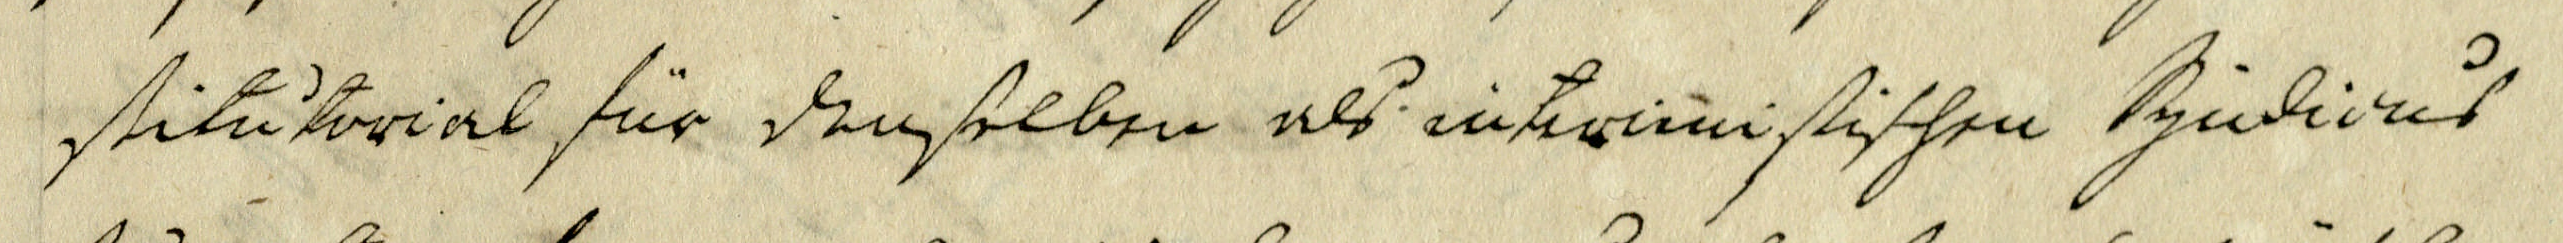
stitutorial für denselben als interimistischen Sÿndicus
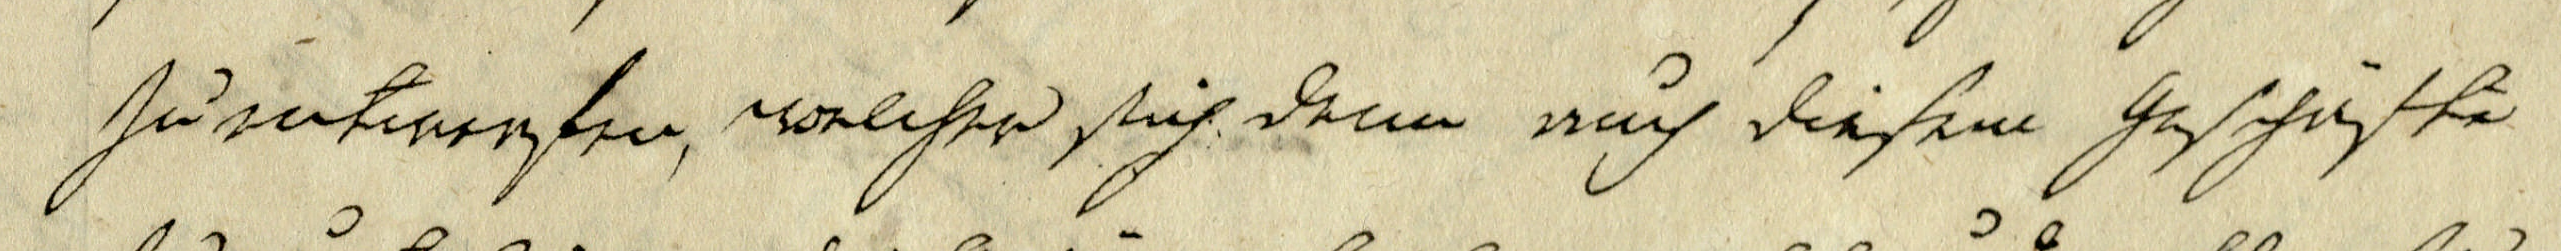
zu entwerfen, welcher sich denn auch diesem Geschäfte
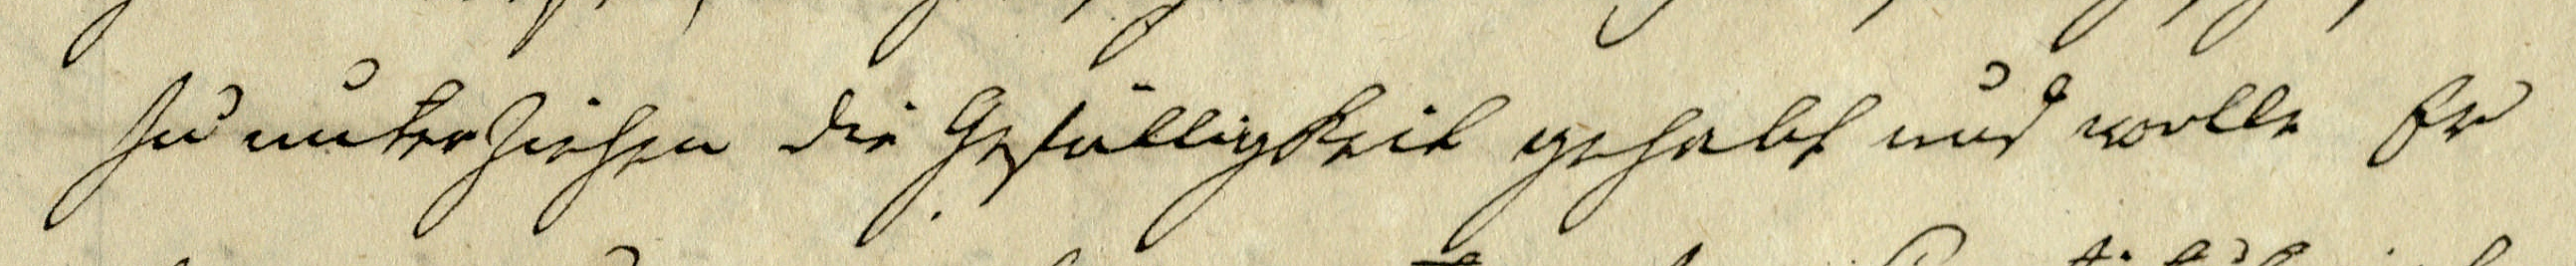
zu unterziehen die Gefälligkeit gehabt und wolle Er
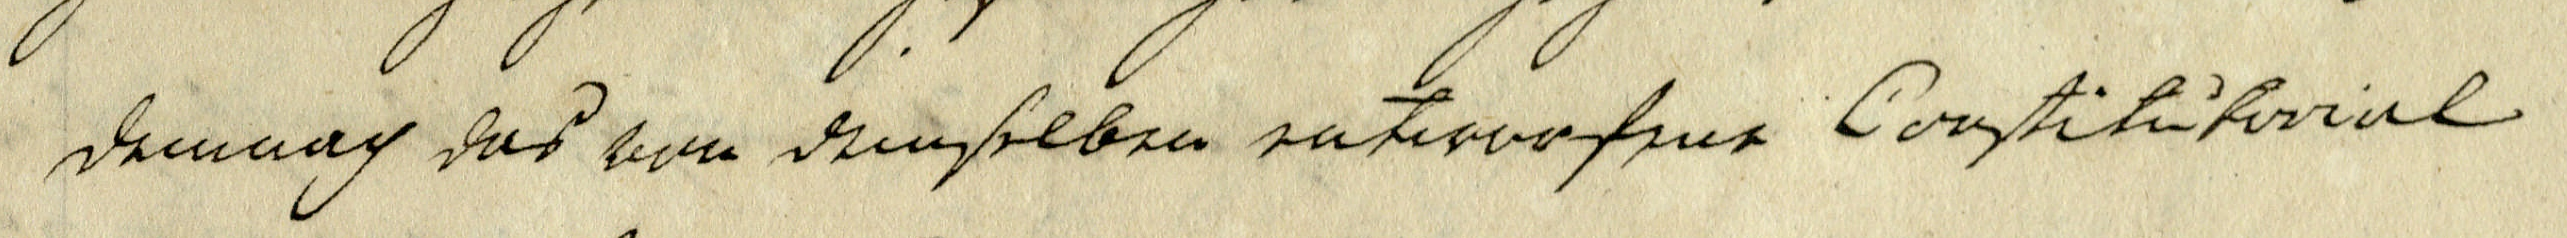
demnach das von demselben entworfene Constitutorial
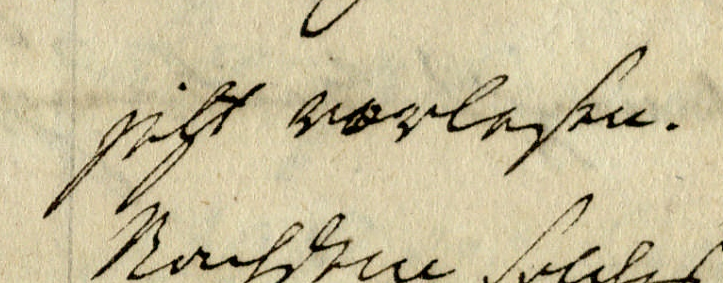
jetzt vorlesen.
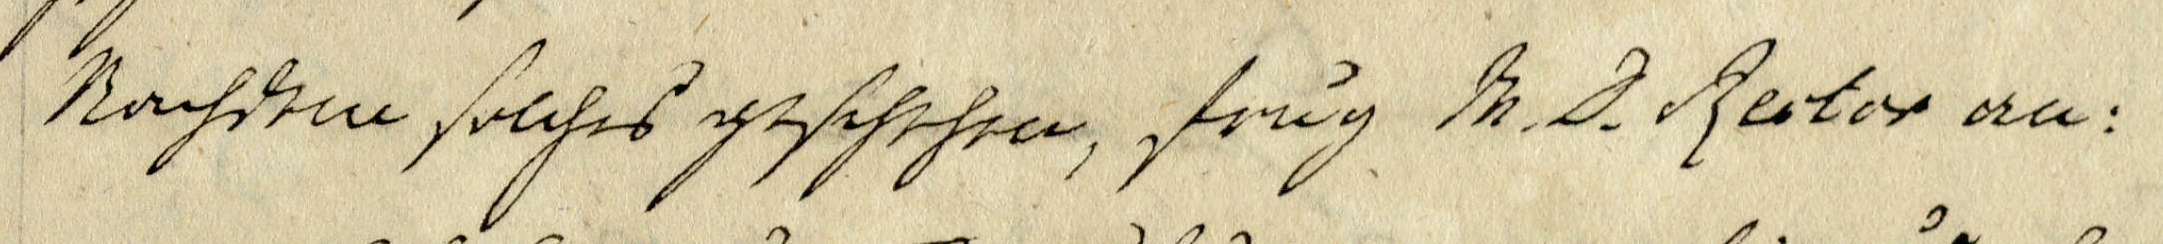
Nachdem solches geschehen, frug M. D. Rector an:
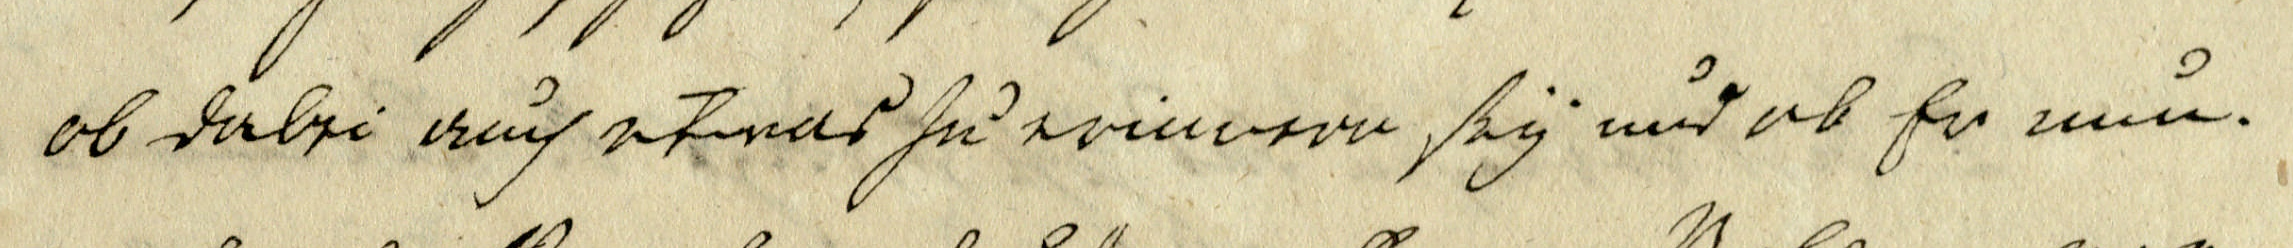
ob dabei auch etwas zu erinnern seÿ und ab Er nun¬
